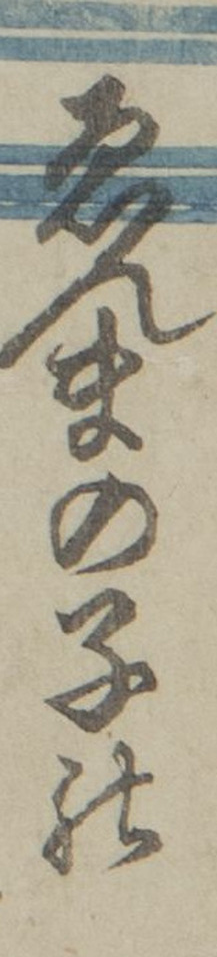ゐんまの子の
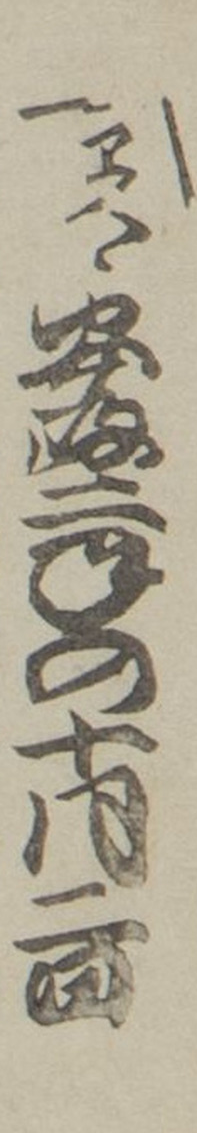〽ヱへヽ安政二年の十月二日
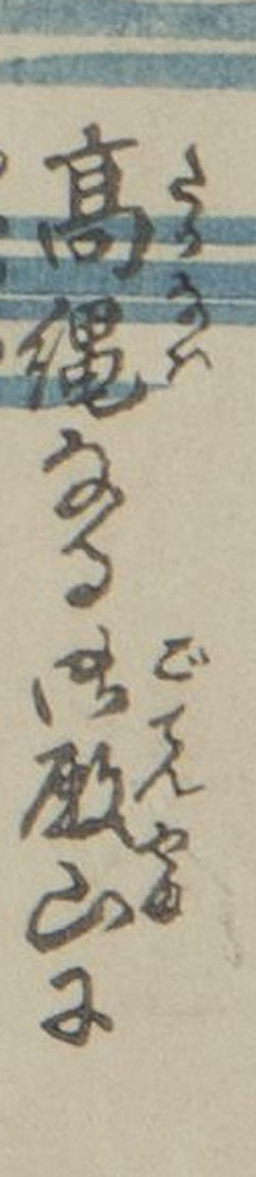高縄なる御殿山に
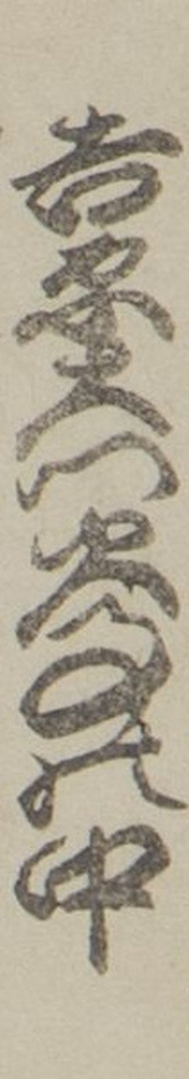吉原大門火事の中
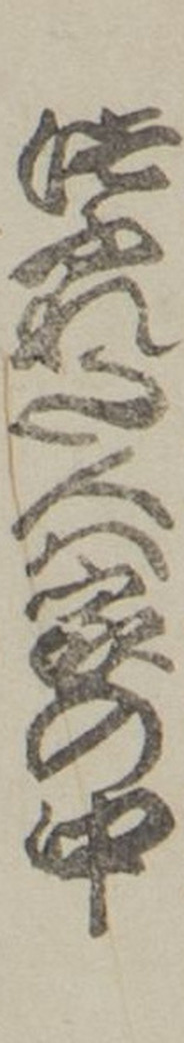つぶれた人は家の中
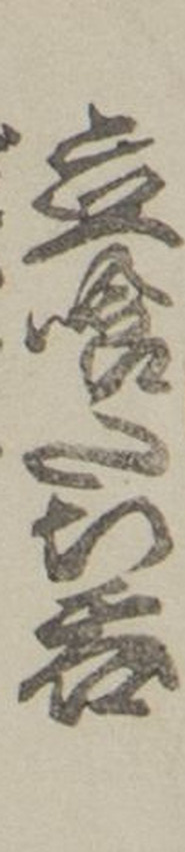立喰たち呑
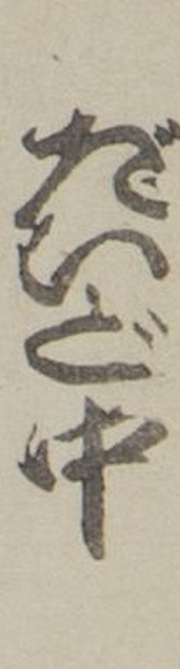だいど中
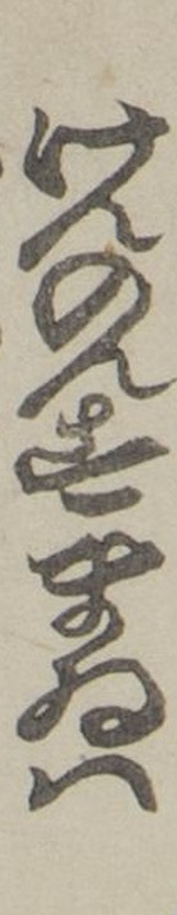けんのんすまゐは
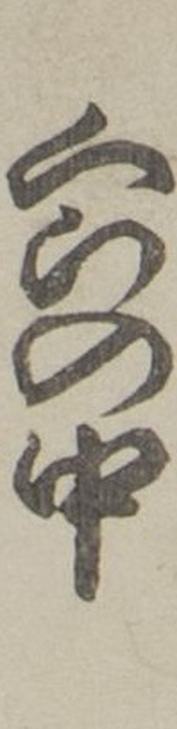くらの中
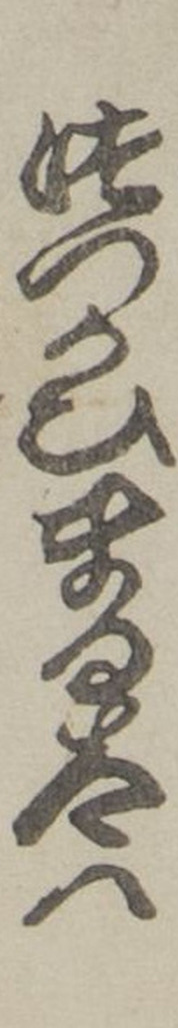つつかひまるたは
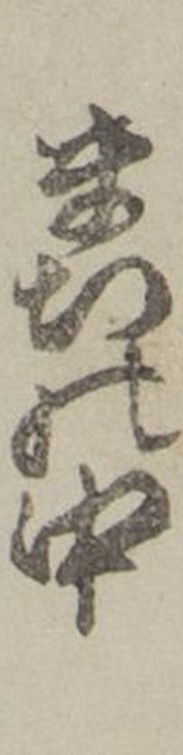まちの中
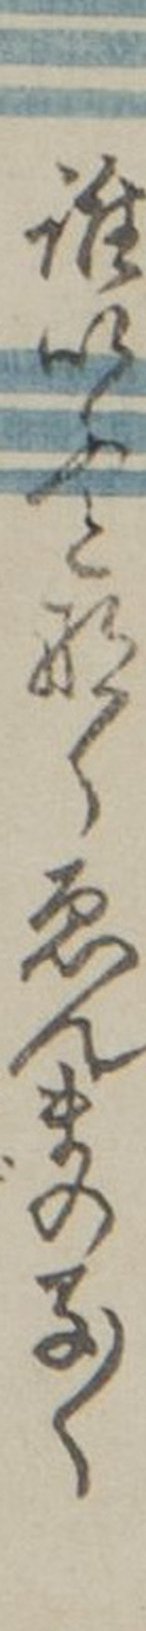誰いふとなくゑんまの子〳〵
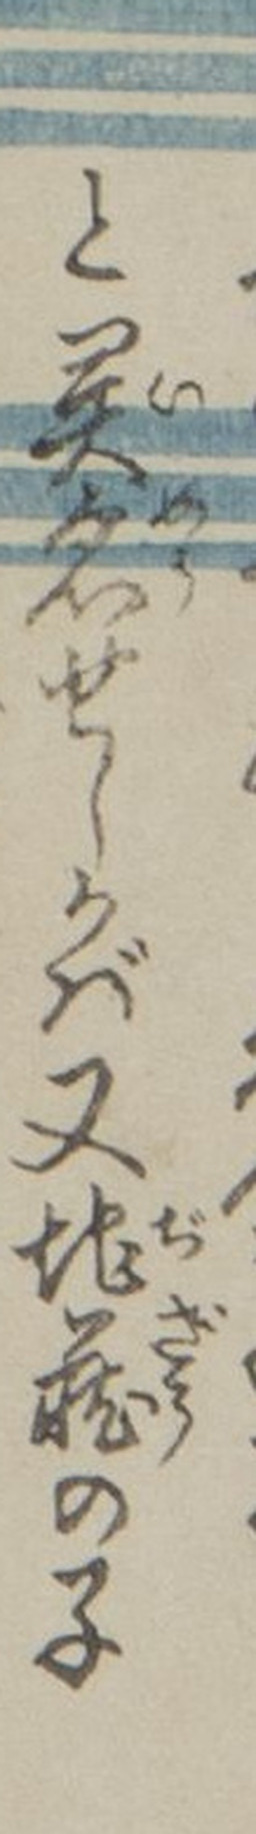と異名せしかば又地蔵の子
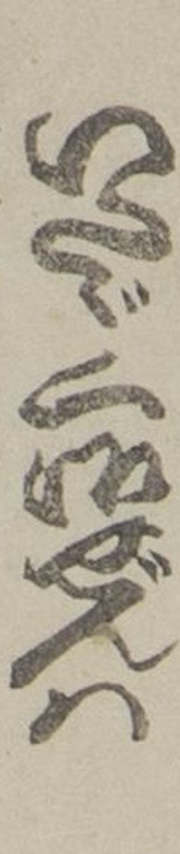いたゞく御ぜんは
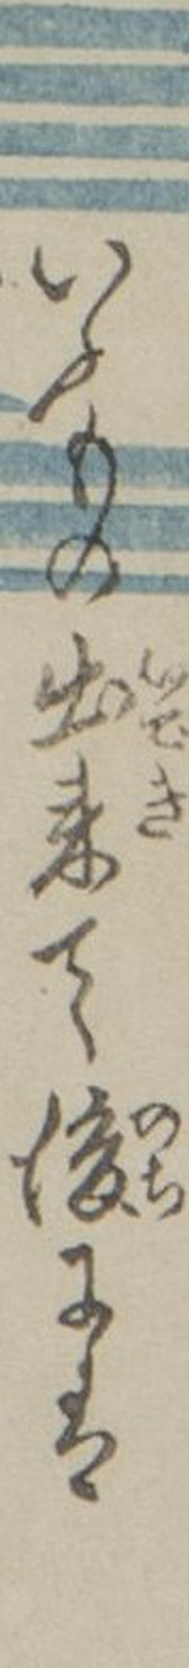いふもの出来て後には
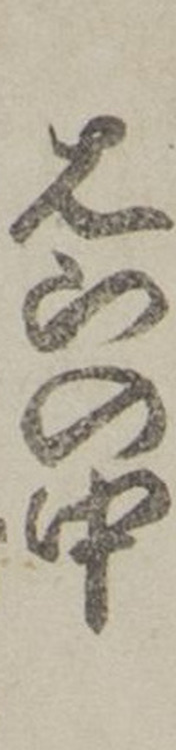はらの中
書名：ゑんまの子のわけ
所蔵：あいおいニッセイ同和損保株式会社
